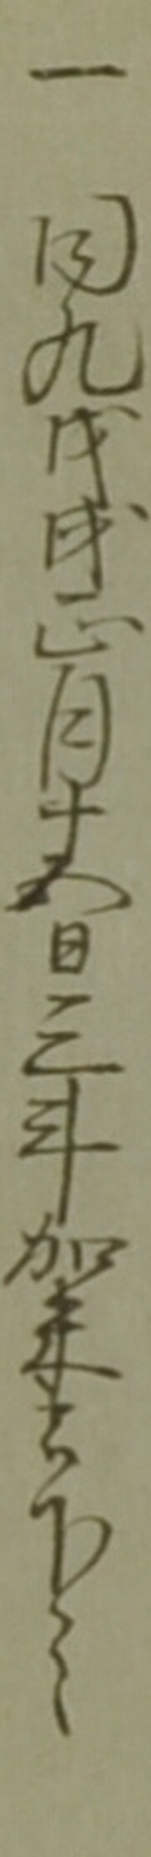一同九戊戌正月十五日三斗加米被下之
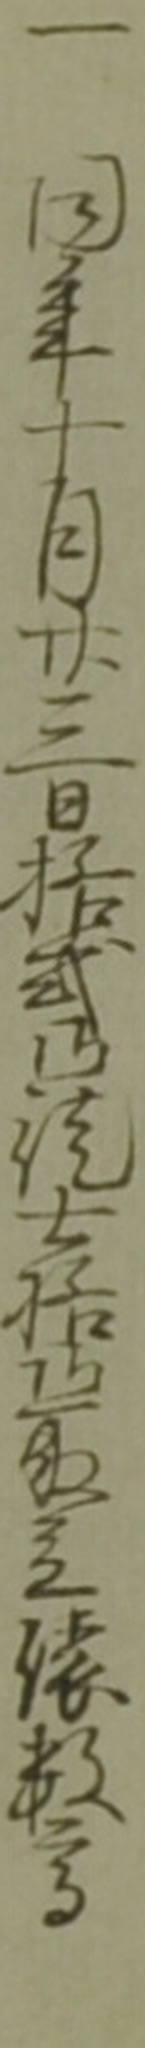一同年十月廿三日格式御徒士格御取立俵数高
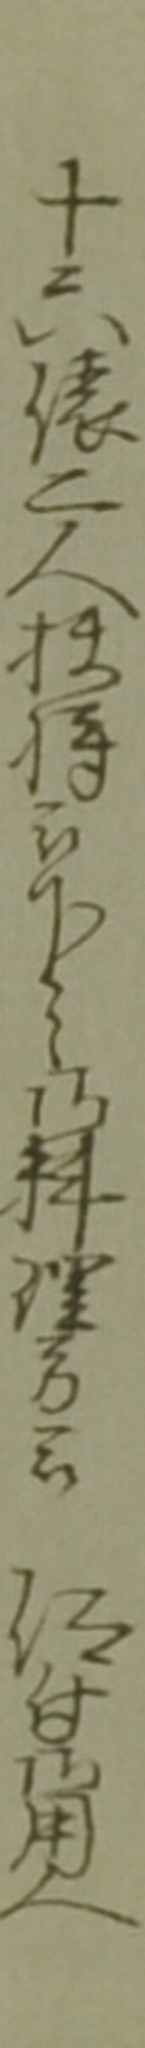十六俵二人扶持被下之御料理方被仰付御用人
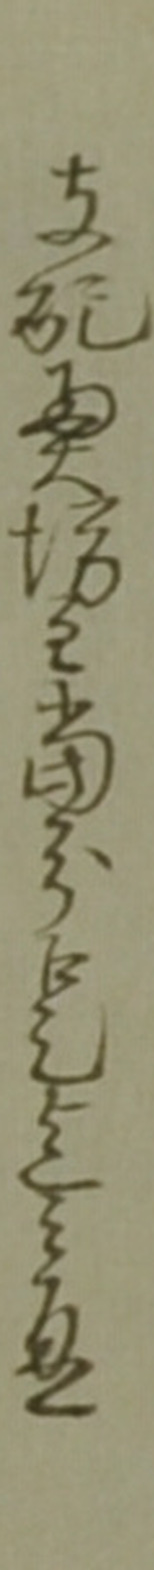支配奥坊主当分是迄之通
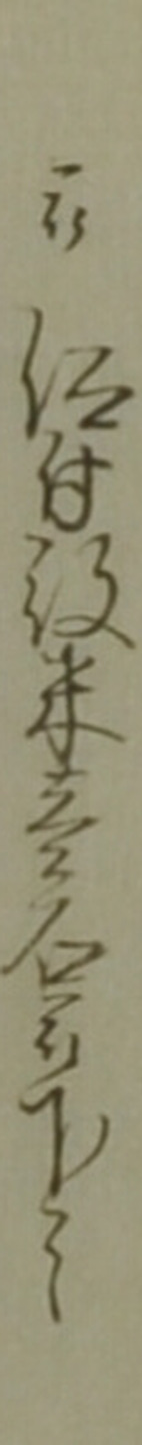被仰付役米壱石被下之
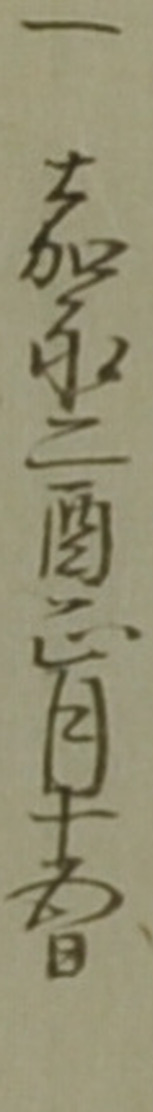一嘉永二酉正月十五日
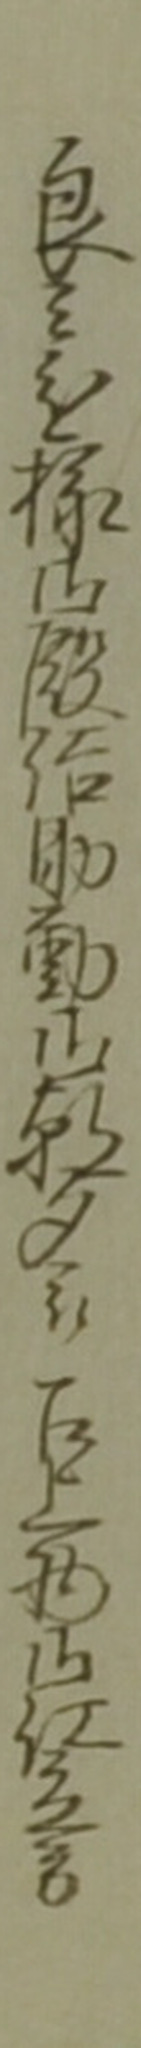良之進様御殿詰助勤御朝夕被召上物御仕立方
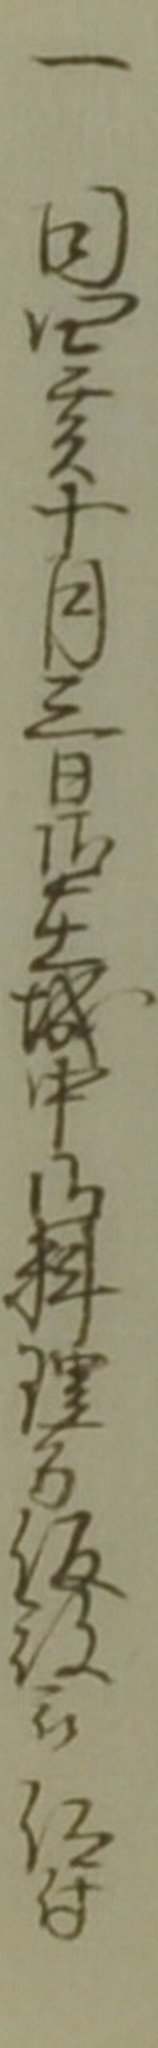一同四亥十月三日御在城中御料理方仮役被仰付
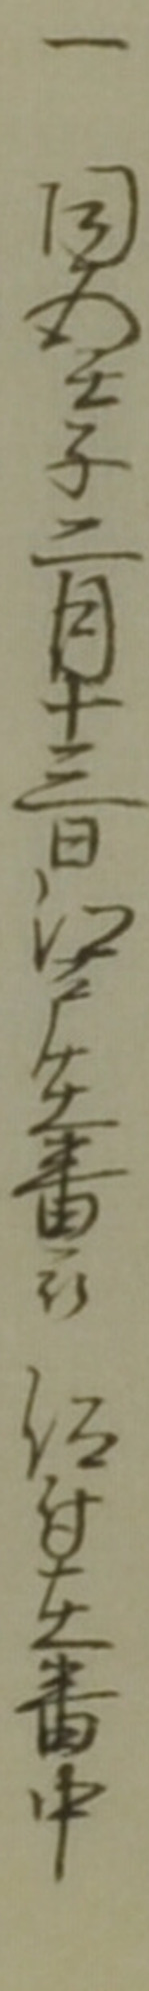一同五壬子二月十三日江戸在番被仰付在番中
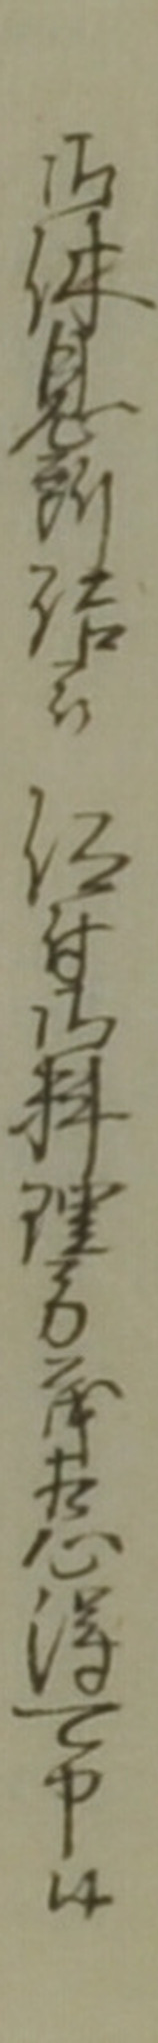御休息所詰被仰付御料理方茂相心得可申候
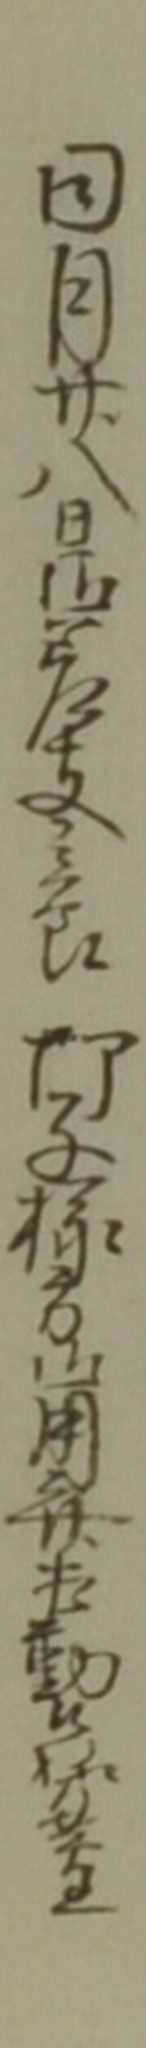同月廿八日御差支之節御子様方御用弁相勤候様通達

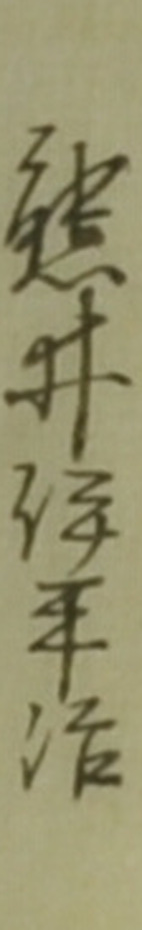熊井伊平治
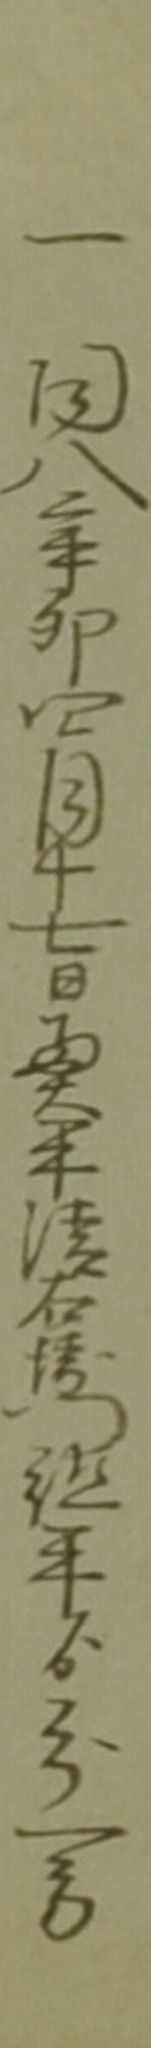一同八辛卯四月十七日奥平清右衛門組平ゟ分一方
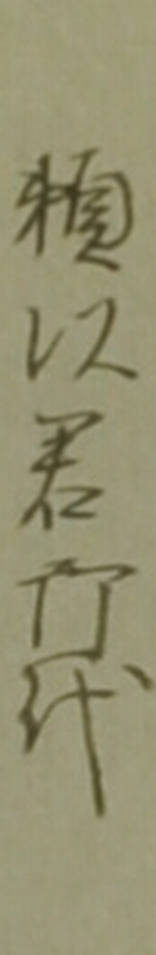頼以君御代
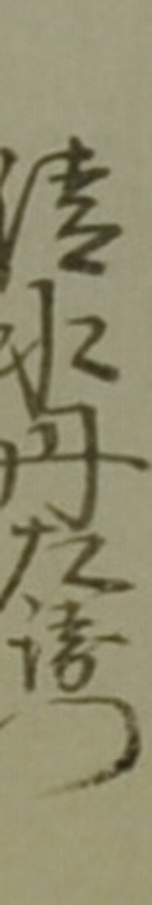清水丹左衛門
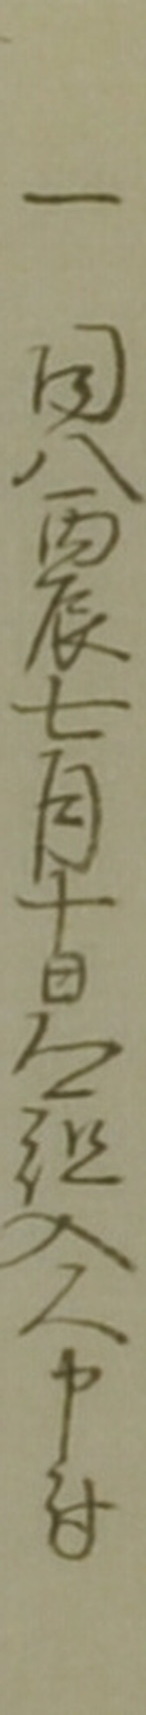一同八丙辰七月十日郷組入人申付
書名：無足諸士勤仕録（八）
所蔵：伊那市立高遠町図書館・合同会社AMANE
